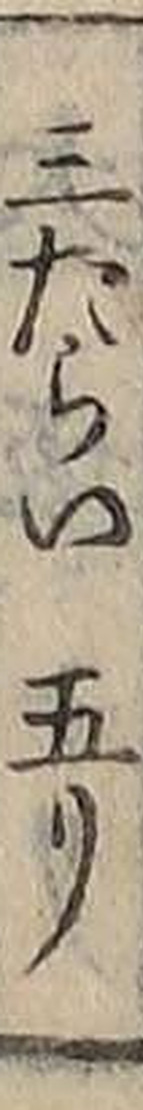みたらい五リ
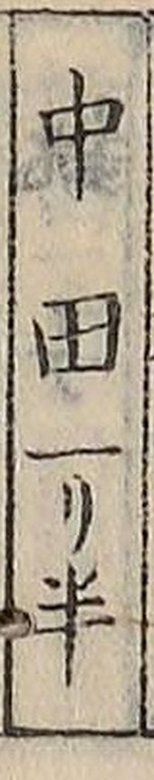中田一リ半
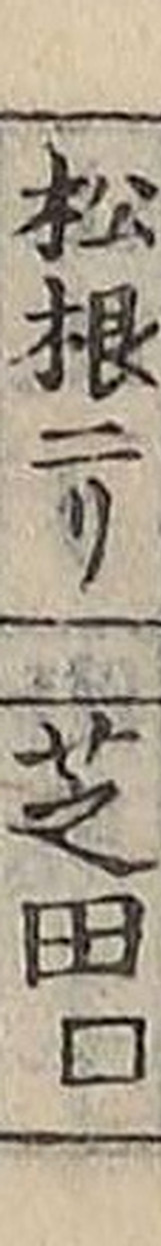松根二リ芝田▫
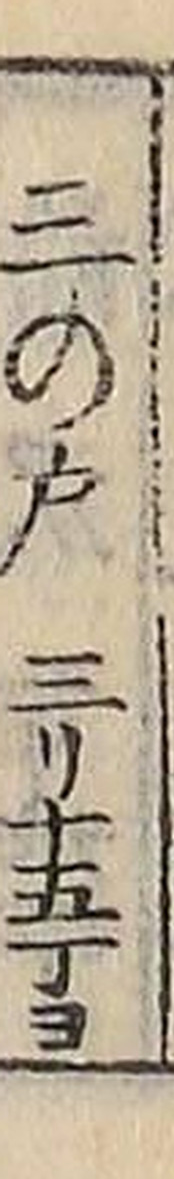三の戸三リ十五丁ヨ
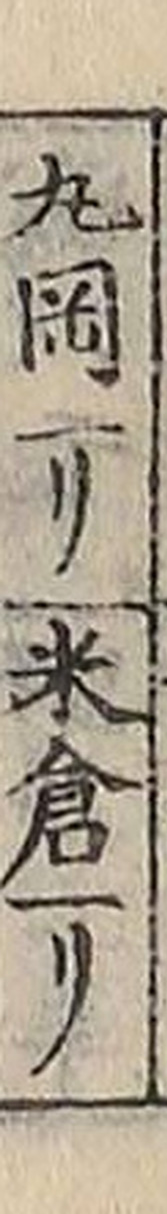丸岡一リ米倉一リ
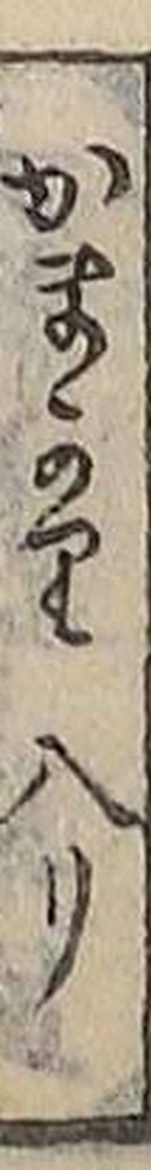かまかり八リ
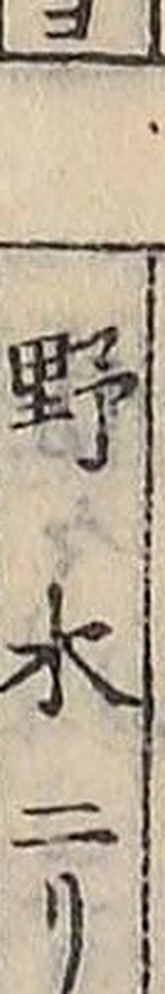野水二リ
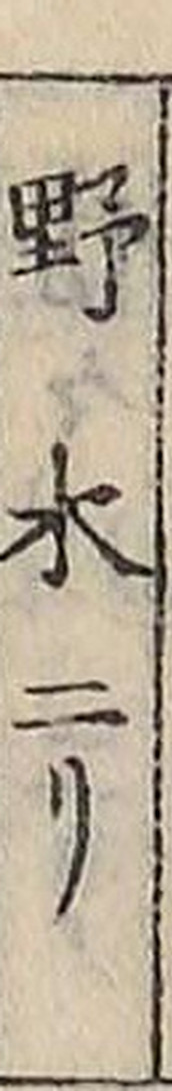野水二リ
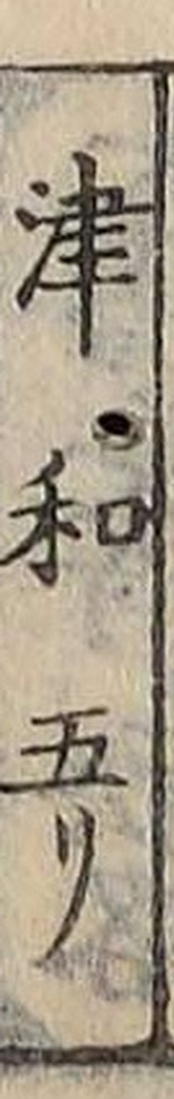津和五リ
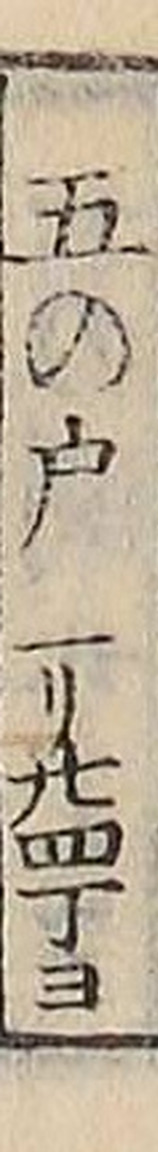五の戸一リ廿四丁ヨ
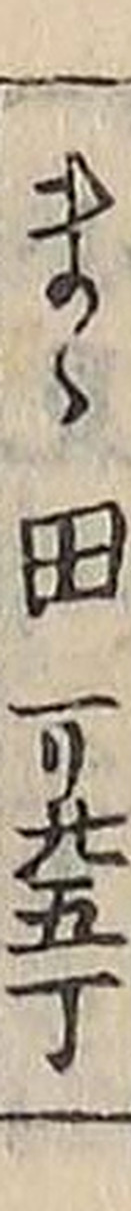まゝ田一リ廿五丁
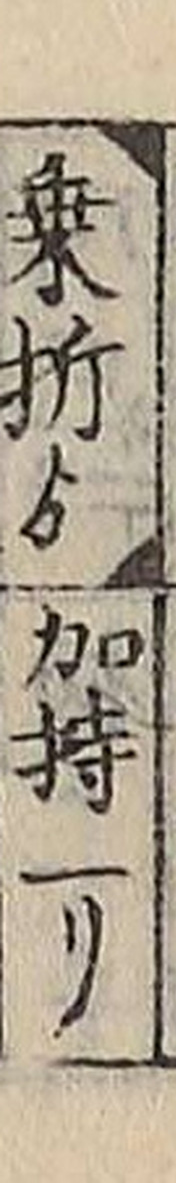乗折ゟ加持一リ
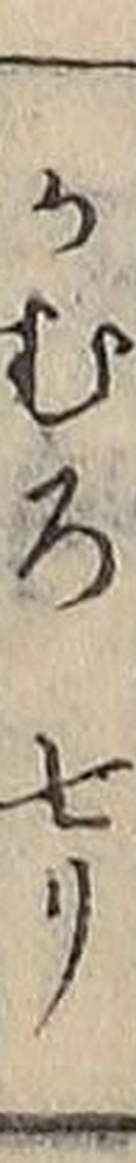かむろ七リ
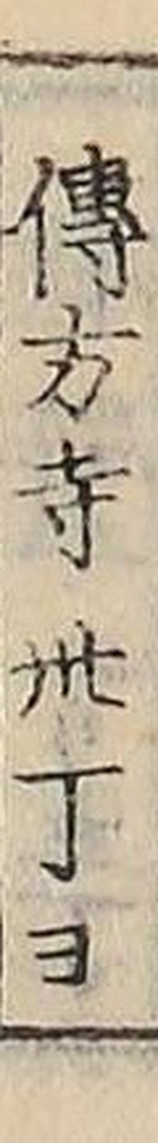伝方寺卅丁ヨ
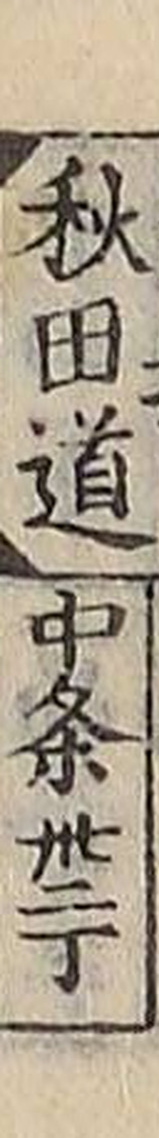秋田道中条卅二丁
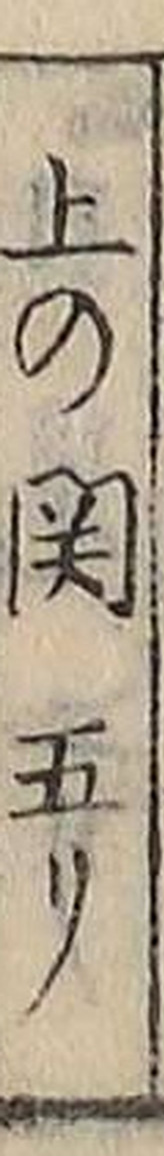上の関五リ
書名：旅行用心集
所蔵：神戸大学附属図書館 国文学研究資料館
